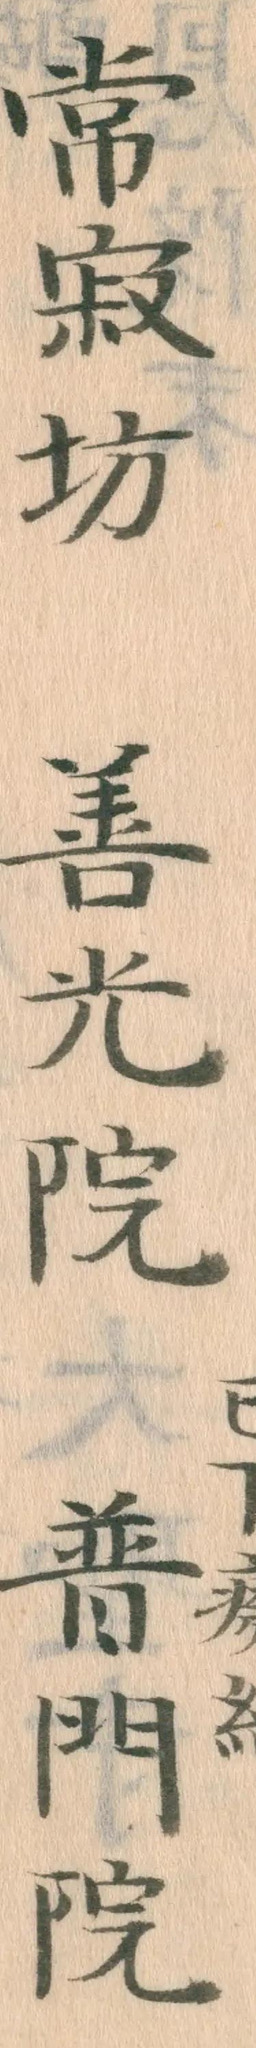常寂坊善光院普門院
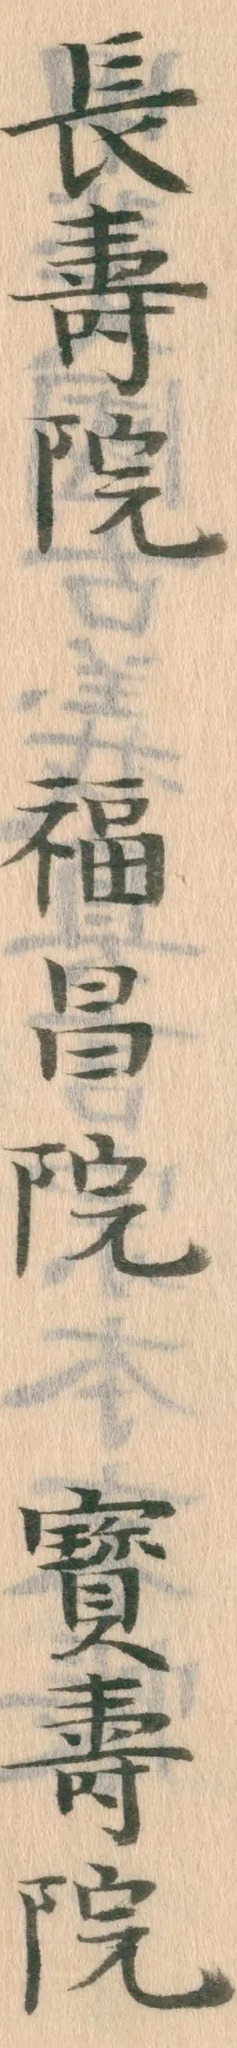長寿院福昌院寶寿院
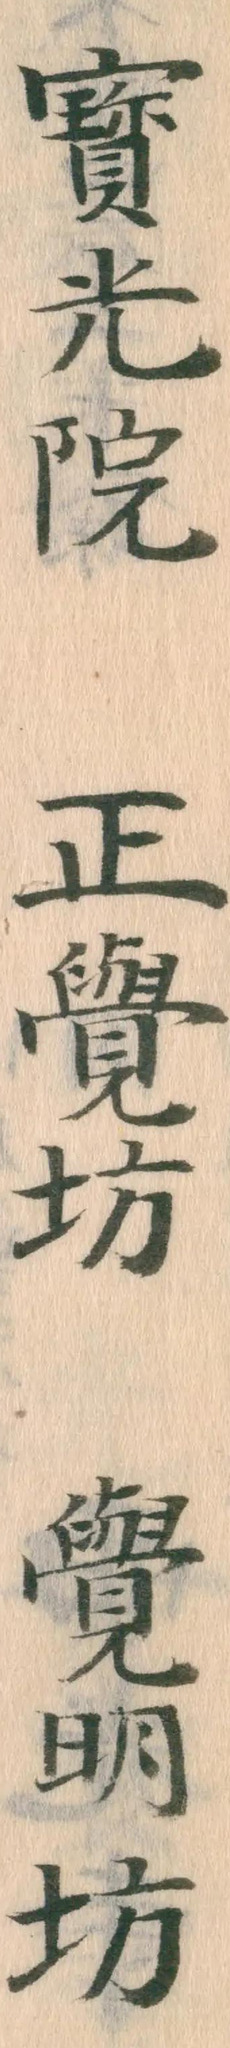実光院正覚坊覚明坊
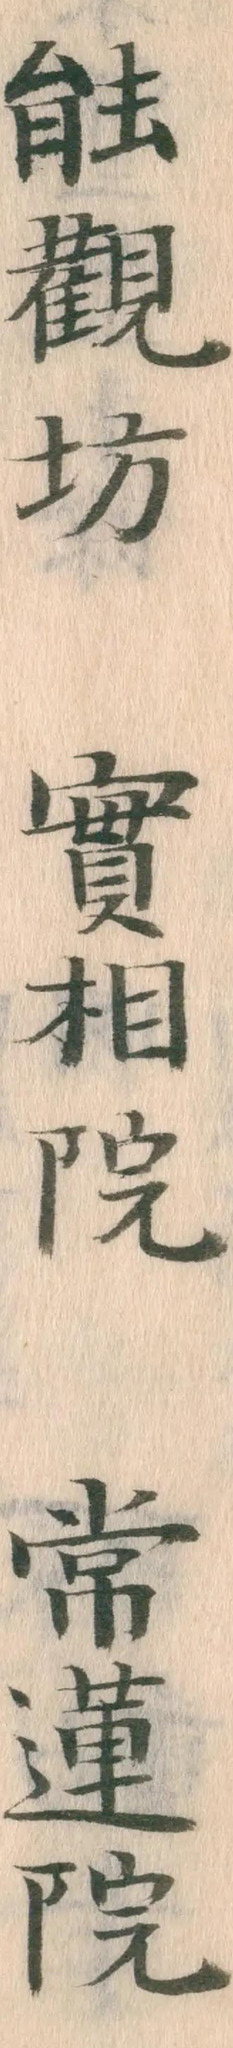能観坊実相院常蓮院
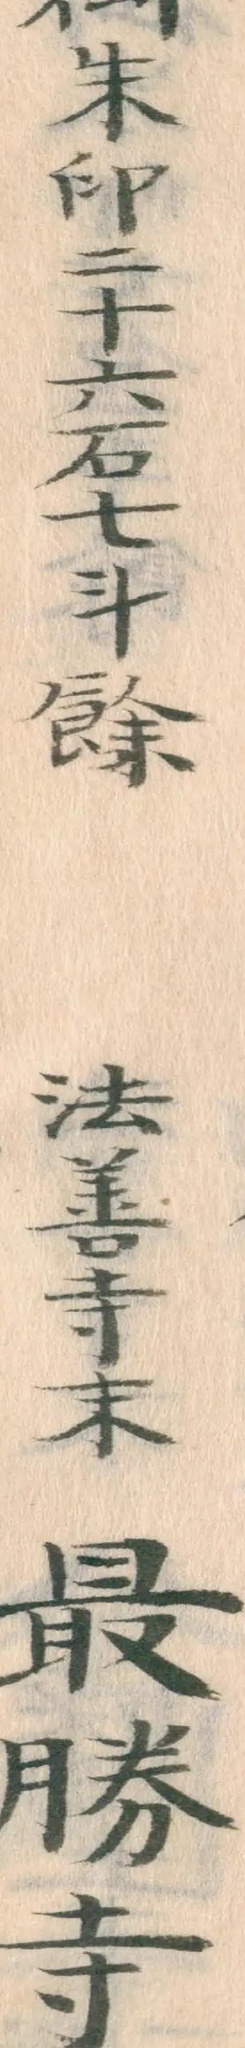御朱印二十六石七斗餘法善寺未最勝寺

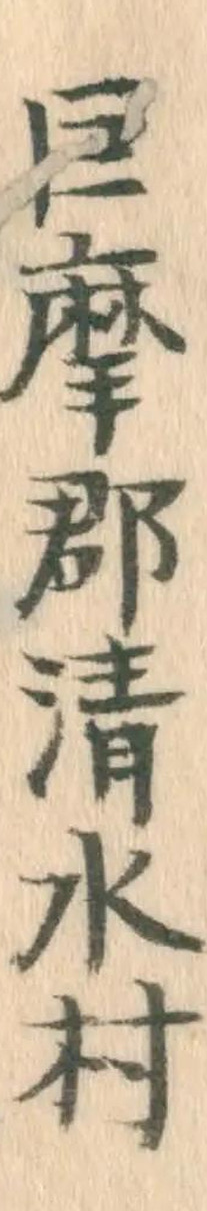巨摩郡清水村
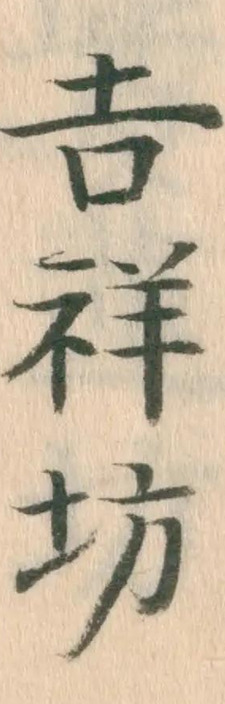吉祥坊
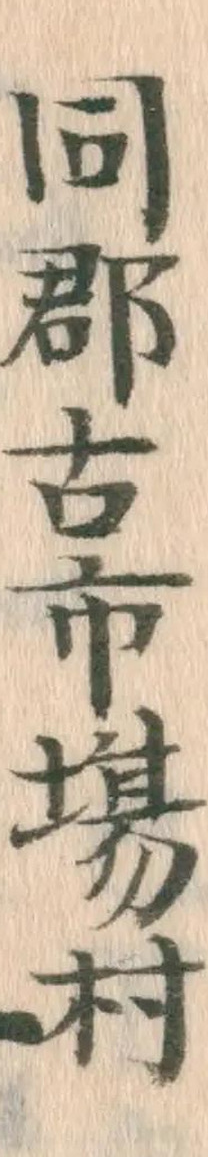同郡古市場村
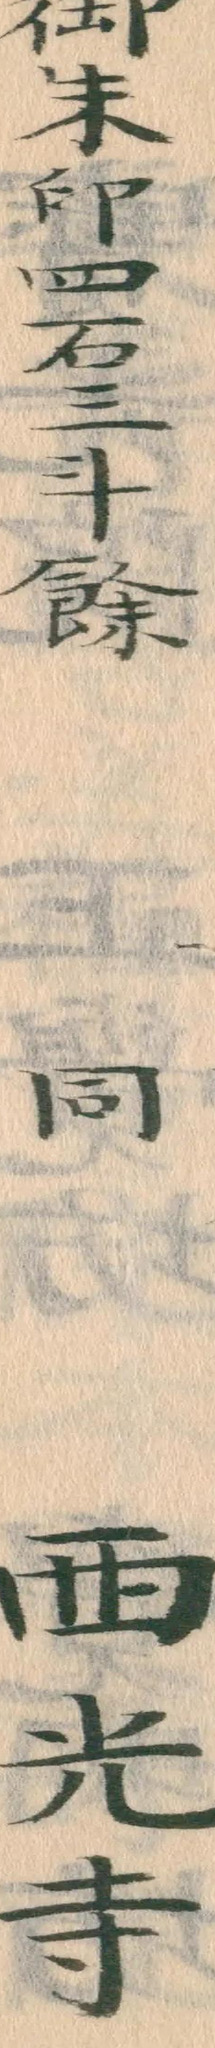御朱印四石三斗餘同西光寺
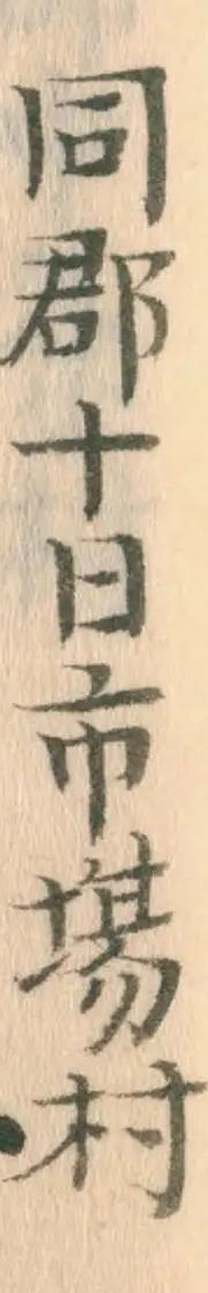同郡十日市場村
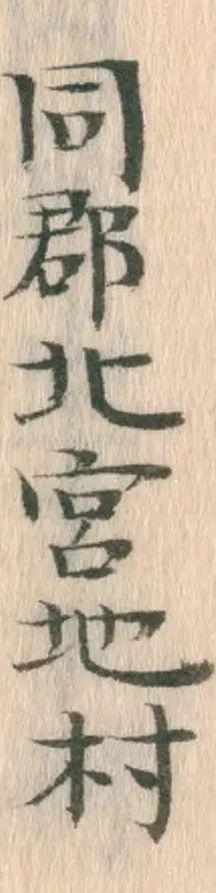同郡北宮地村
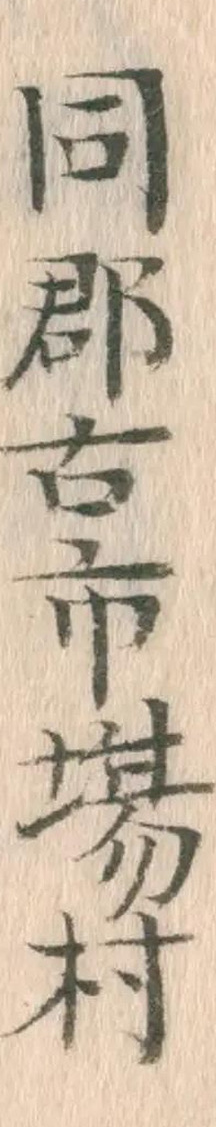同郡古市場村
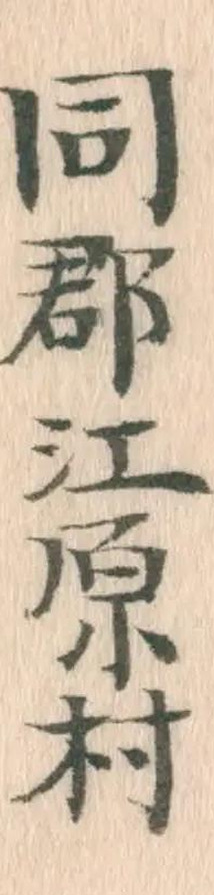同郡江原村

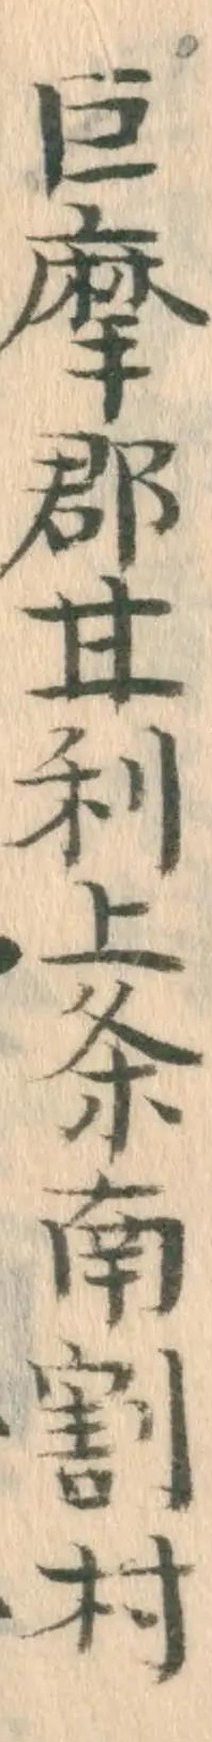巨摩軍甘利上条南割村
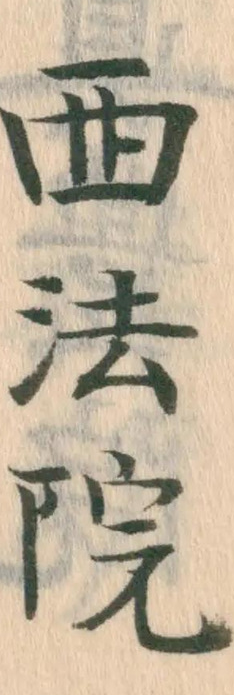西法院
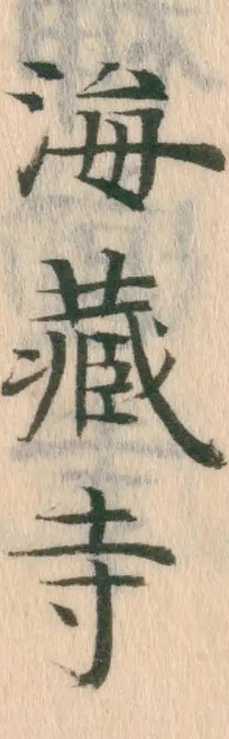海蔵寺
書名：古義真言宗本末帳 21巻. [4] 第三 伊賀国、伊勢国、志摩国、尾張国、三河国、遠江国、駿河国、伊豆国、甲斐国
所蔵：国立国会図書館 National Diet Library, JAPAN
